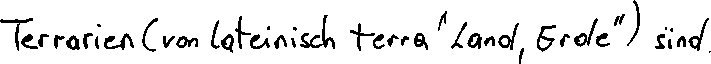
Terrarien (von lateinisch terra "Land, Erde") sind
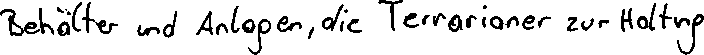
Behälter und Anlagen, die Terrarianer zur Haltung
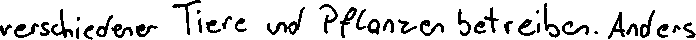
verschiedener Tiere und Pflanzen betreiben. Anders
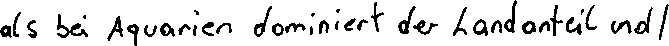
als bei Aquarien dominiert der Landanteil und/
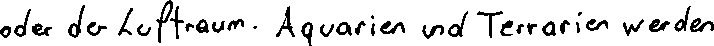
oder der Luftraum. Aquarien und Terrarien werden
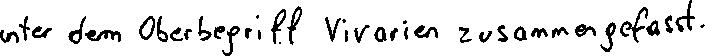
unter dem Oberbegriff Vivarien zusammengefasst.
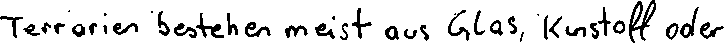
Terrarien bestehen meist aus Glas, Kunststoff oder
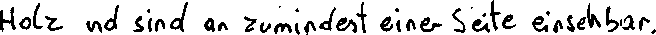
Holz und sind an zumindest einer Seite einsehbar.
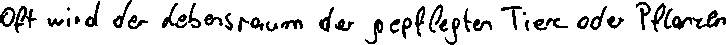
Oft wird der Lebensraum der gepflegten Tiere oder Pflanzen
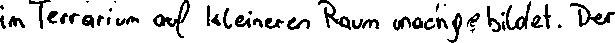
im Terrarium auf kleinerem Raum nachgebildet. Der
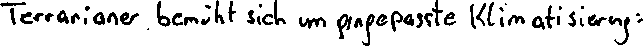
Terrarianer bemüht sich um angepasste Klimatisierung:
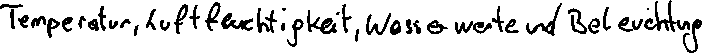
Temperatur, Luftfeuchtigkeit, Wasserwerte und Beleuchtung
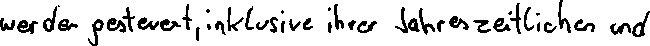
werden gesteuert, inklusive ihrer jahreszeitlichen und
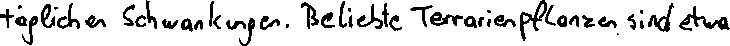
täglichen Schwankungen. Beliebte Terrarienpflanzen sind etwa
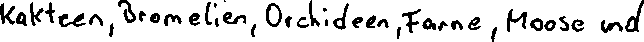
Kakteen, Bromelien, Orchideen, Farne, Moose und
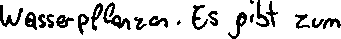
Wasserpflanzen. Es gibt zum
